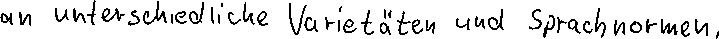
an unterschiedliche Varietäten und Sprachnormen,
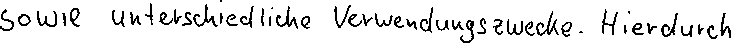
sowie unterschiedliche Verwendungszwecke. Hierdurch
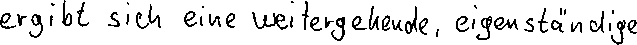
ergibt sich eine weitergehende, eigenständige
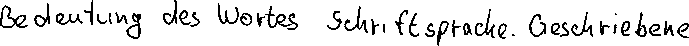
edeutung des Wortes Schriftsprache. Geschriebene
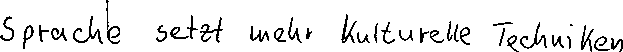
Sprache setzt mehr kulturelle Techniken
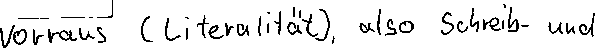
voraus (Literalität), also Schreib-und
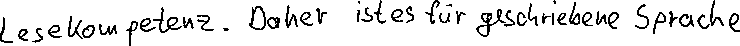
Lesekompetenz. Daher ist es für geschriebene Sprache
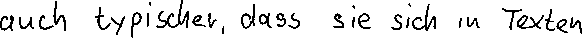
auch typischer, dass sie sich in Texten
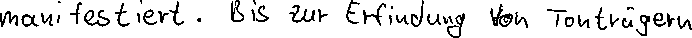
manifestiert. Bis zur Erfindung von Tonträgern
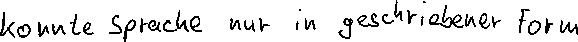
konnte Sprache nur in geschriebener Form
